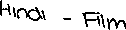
Hindi-Film
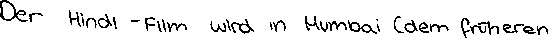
Der Hindi-Film wird in Mumbai (dem früheren
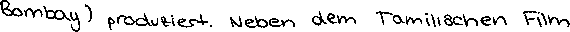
Bombay) produziert. Neben dem Tamilischen Film
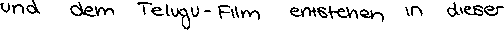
und dem Telugu-Film entstehen in dieser
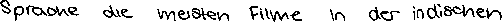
Sprache die meisten Filme in der indischen
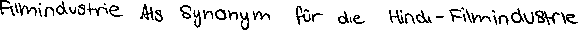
Filmindustrie. Als Synonym für die Hindi-Filmindustrie
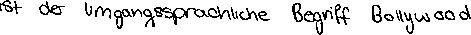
ist der umgangssprachliche Begriff Bollywood
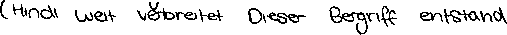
(Hindi weit verbreitet. Dieser Begriff entstand
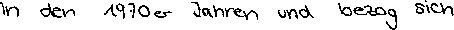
in den 1970er Jahren und bezog sich
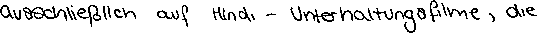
ausschließlich auf Hindi-Unterhaltungsfilme, die
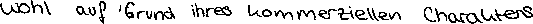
wohl auf Grund ihres kommerziellen Charakters
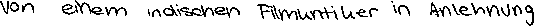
von einem indischen Filmkritiker in Anlehnung
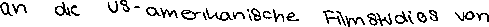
an die US-amerikanischen Filmstudios von
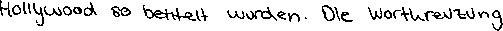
Hollywood so betitelt wurden. Die Wortkreuzung
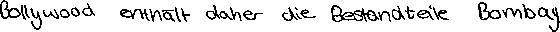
Bollywood enthält daher die Bestandteile Bombay
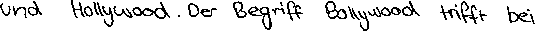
und Hollywood. Der Begriff Bollywood trifft
